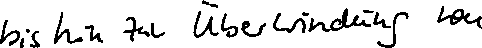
bis hin zur Überwindung von
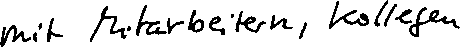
mit Mitarbeitern, Kollegen
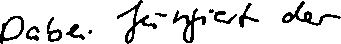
Dabei fungiert der
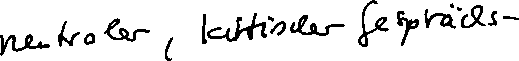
neutraler, kritischer Gesprächs-
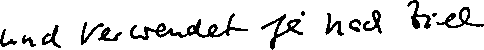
und verwendet je nach Ziel
